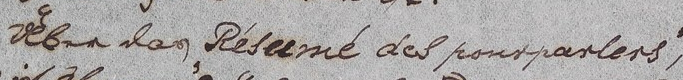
Über das «Résumé des pourparlers»,
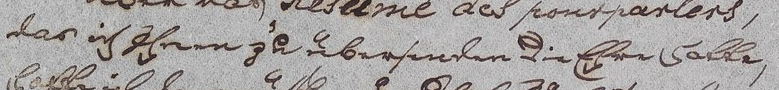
das ich Ihnen zu übersenden die Ehre hatte,
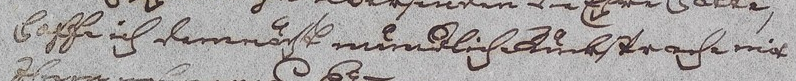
hoffe ich demnächst mündliche Rücksprache mit
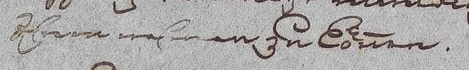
Ihnen nehmen zu können.
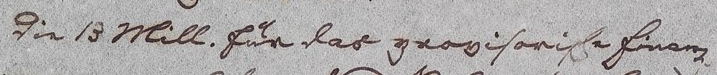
Die 13 Mill. für das provisorische Finanz-
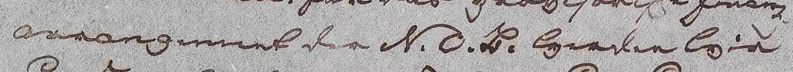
arrangement der N.O.B. werden wir
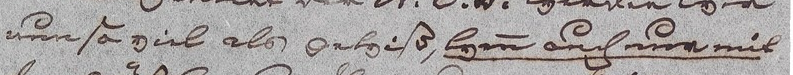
nun so viel als gewiß, wenn auch nur mit
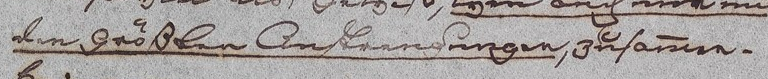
den größten Anstrengungen, zusammen-
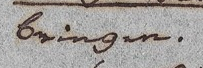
bringen.
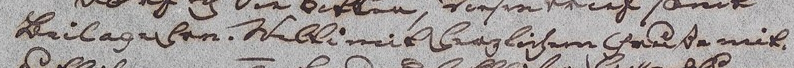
Beilage Hrn. Welti mit herzlichem Gruße mit-
